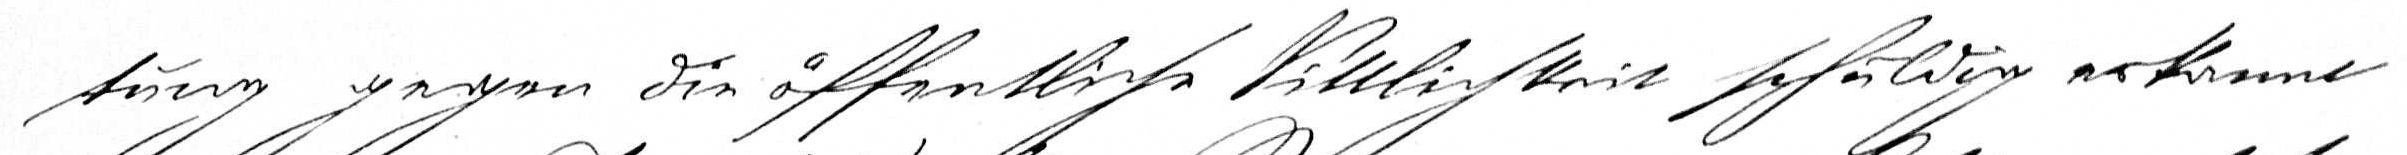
tung gegen die öffentliche Sittlichkeit schuldig erkannt
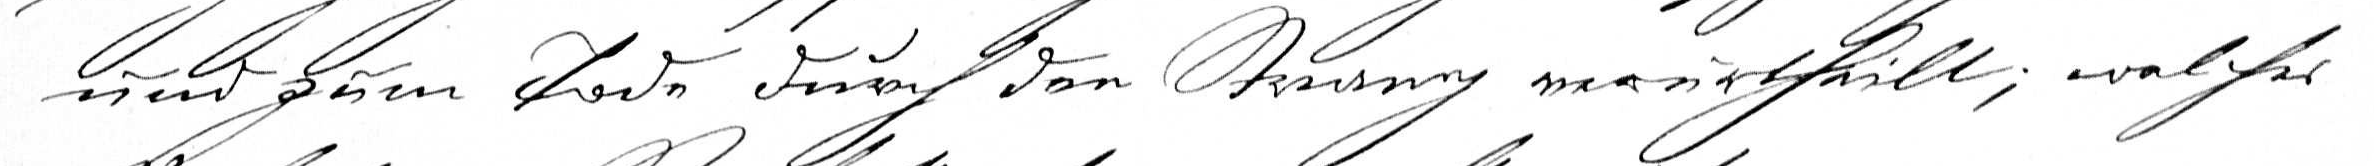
und zum tode durch den Strang verurtheilt, welches
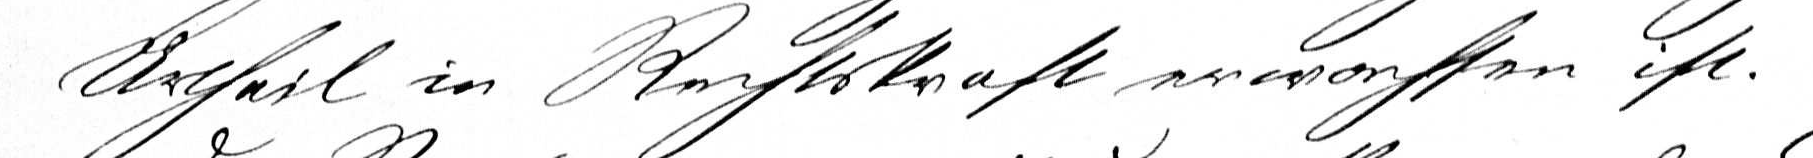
Urtheil in Rechtskraft erwachsen ist.
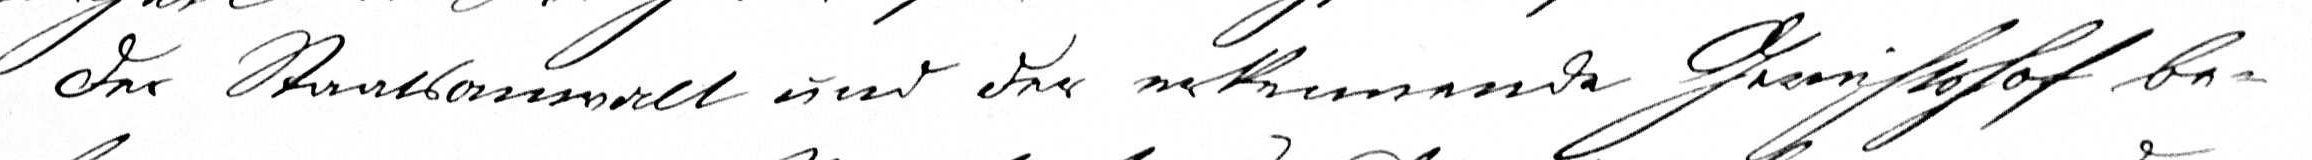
Der Staatsanwalt und der erkennende Gerichtshof be¬
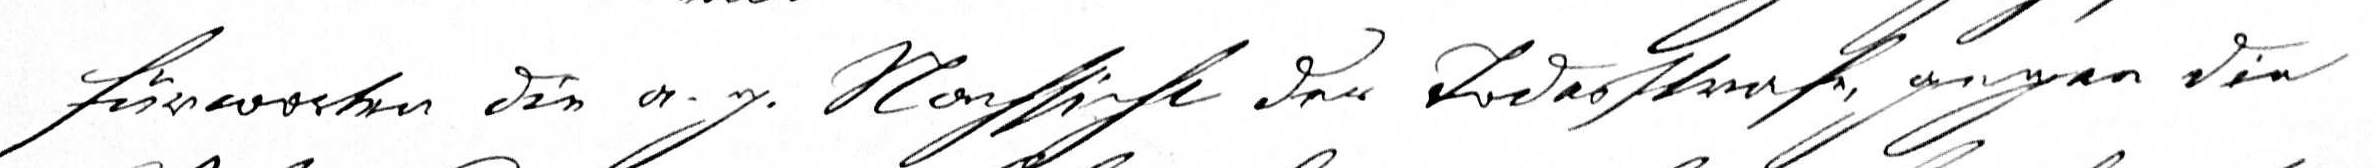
fürworten die a.g. Nachsicht der Todesstrafe, gegen die
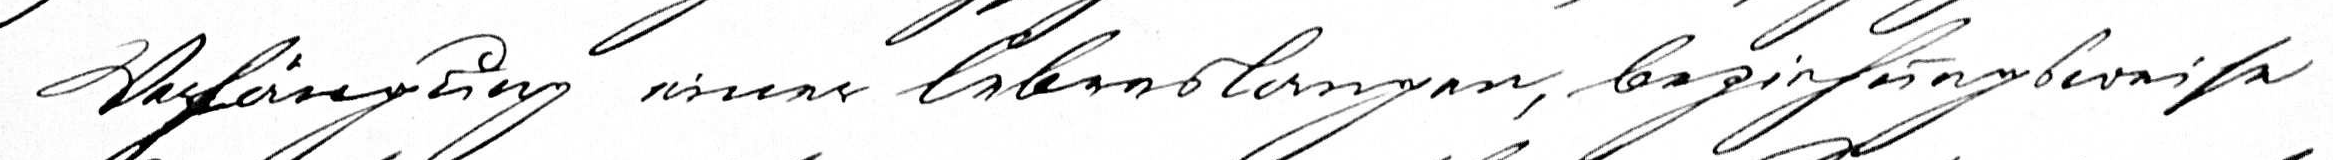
Verhängung einer lebenslangen, beziehungsweise
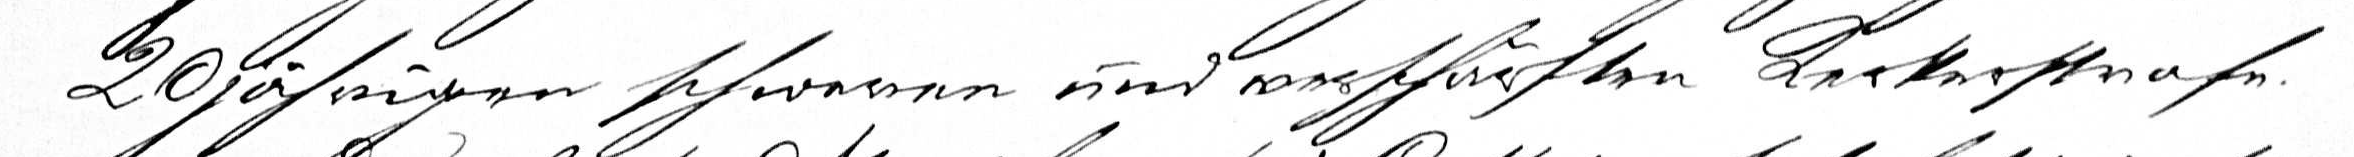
20jährigen schweren und verschärften Kerkerstrafe.
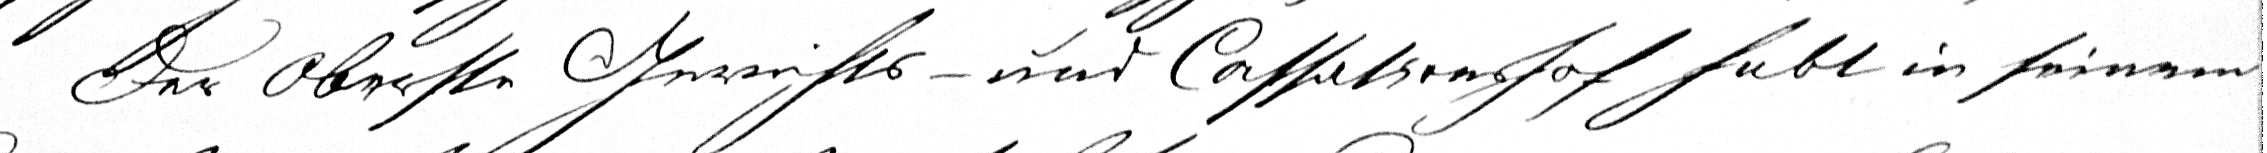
Der oberste Gerichts- und Cassationshof hebt in seinem
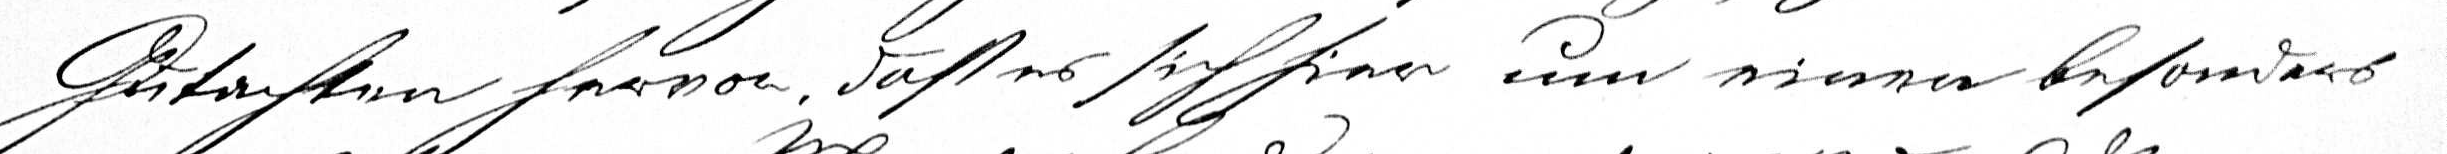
Gutachten hervor, daß es sich hier um einen besonders
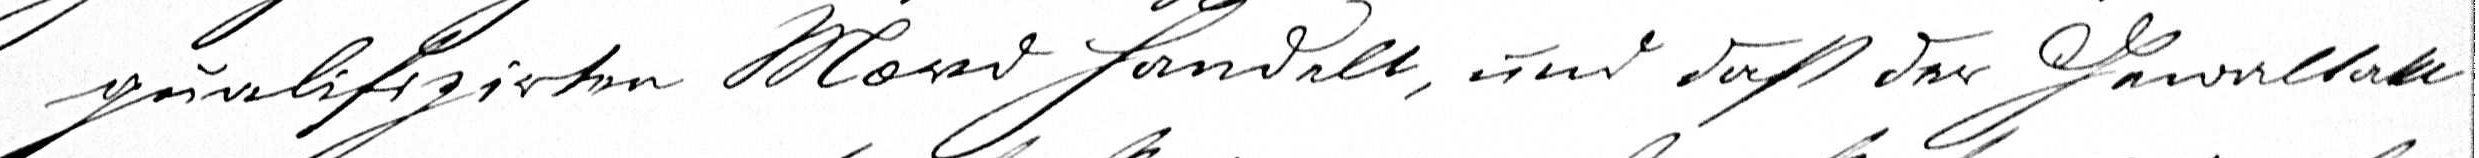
qualifizirten Mord handelt, und daß der Gewaltakt
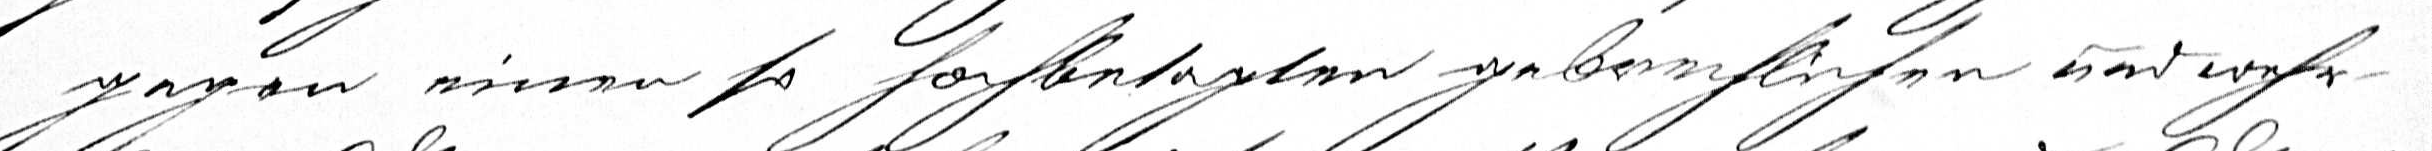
gegen eine so hochbelegten gebrechlichen und wehr¬
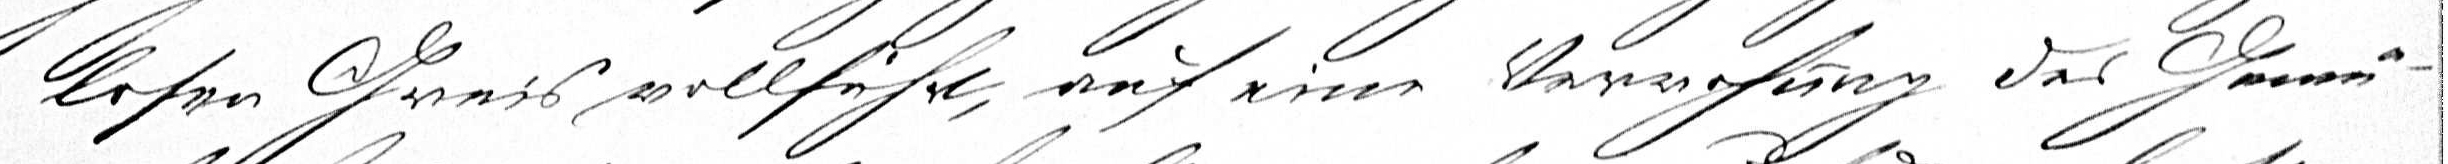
losen Greis vollführt, auf eine Verrohung des Gemü¬
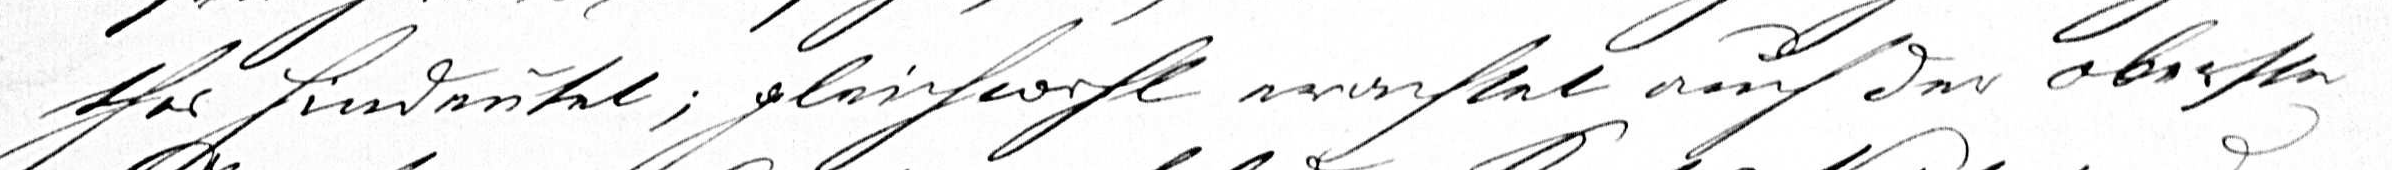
thes hindeutet; gleichwehl erachtet auch der oberste
